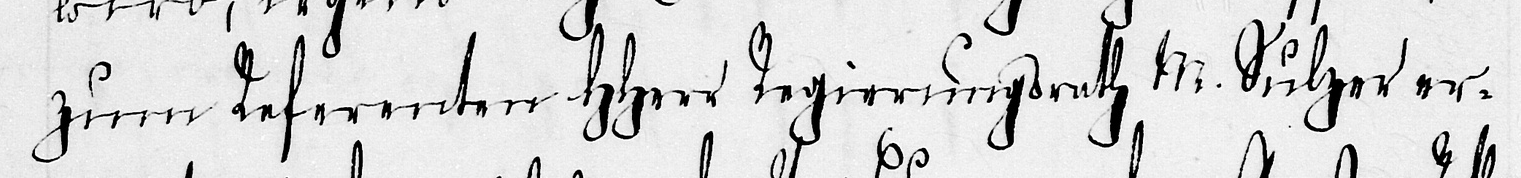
zum Referenten HHerr Regierungsrath M. Sulzer er¬
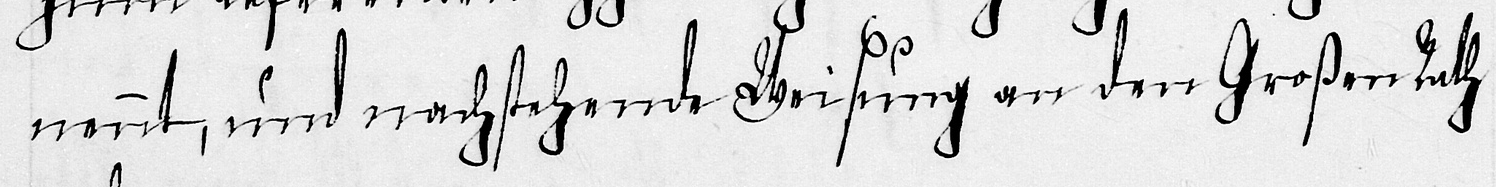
nennt, und nachstehende Weisung an den Großen Rath
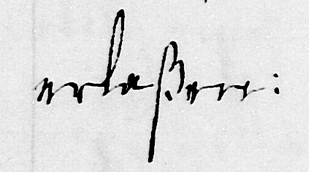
erlaßen:
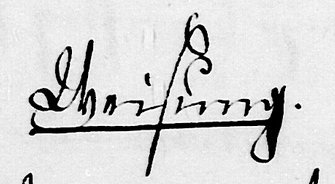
Weisung.
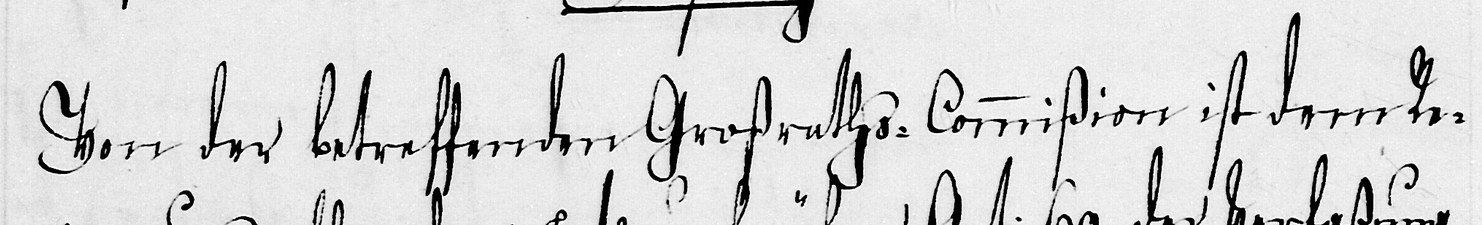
Von der betreffenden Großraths-Commißion ist dem Re¬
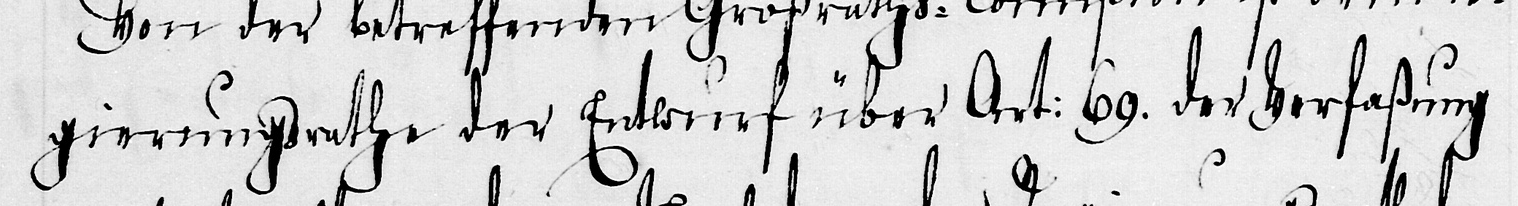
gierungsrathe der Entwurf über Art: 69. der Verfaßung
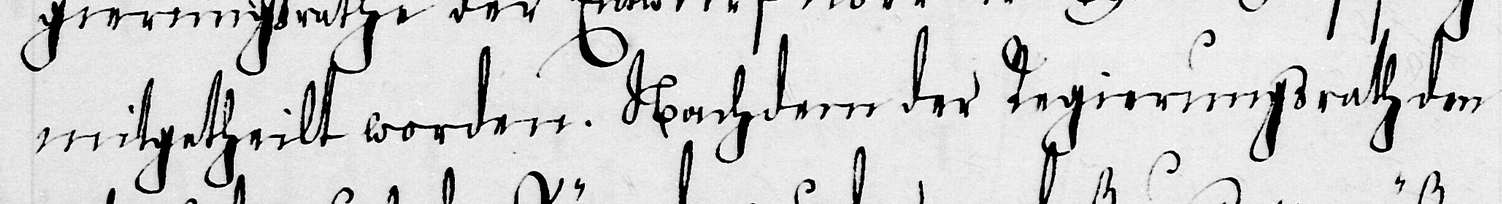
mitgetheilt worden. Nachdem der Regierungsrath den
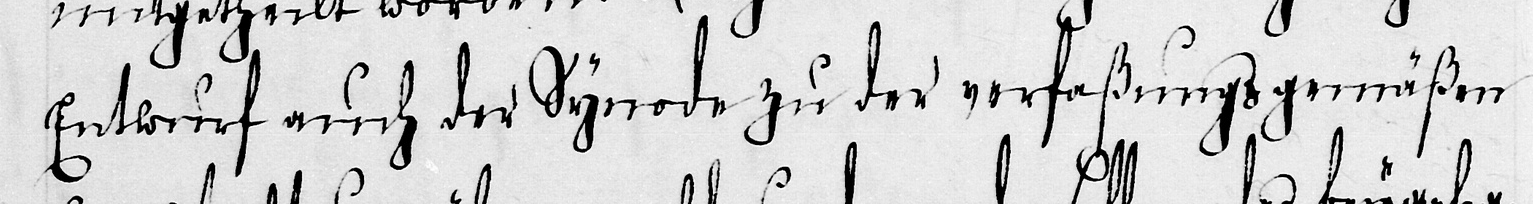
Entwurf auch der Synode zu der verfaßungsgemäßen
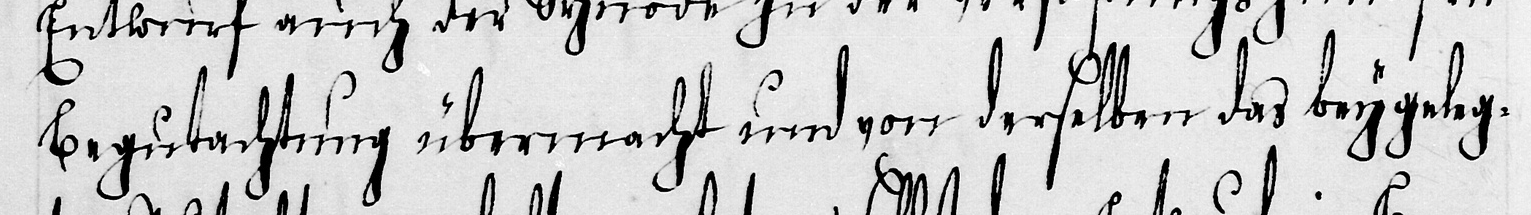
Begutachtung übermacht und von derselben das beygeleg¬
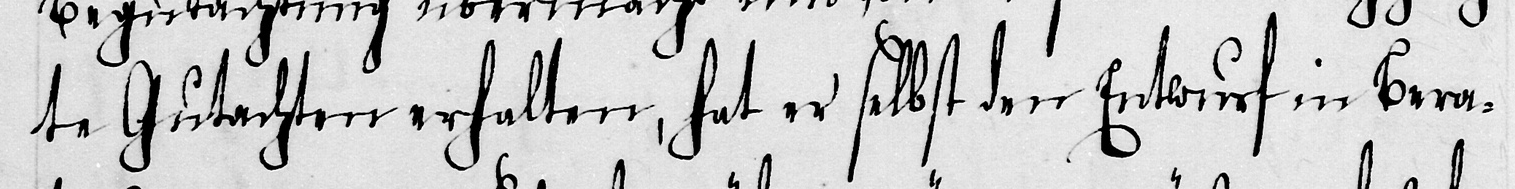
te Gutachten erhalten, hat er selbst den Entwurf in Bera¬
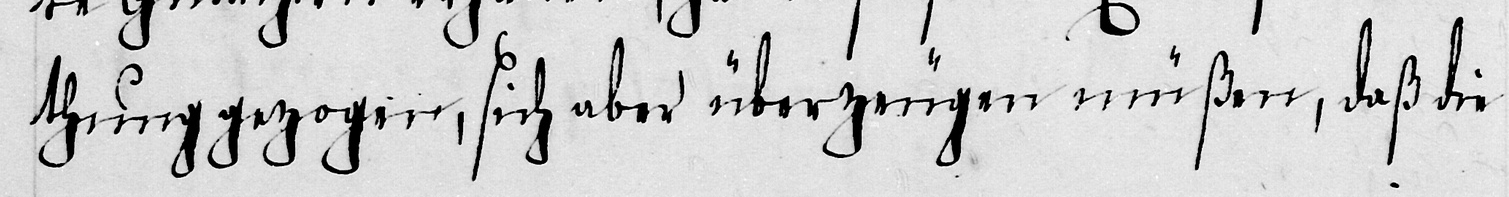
thung gezogen, sich aber überzeugen müßen, daß die
